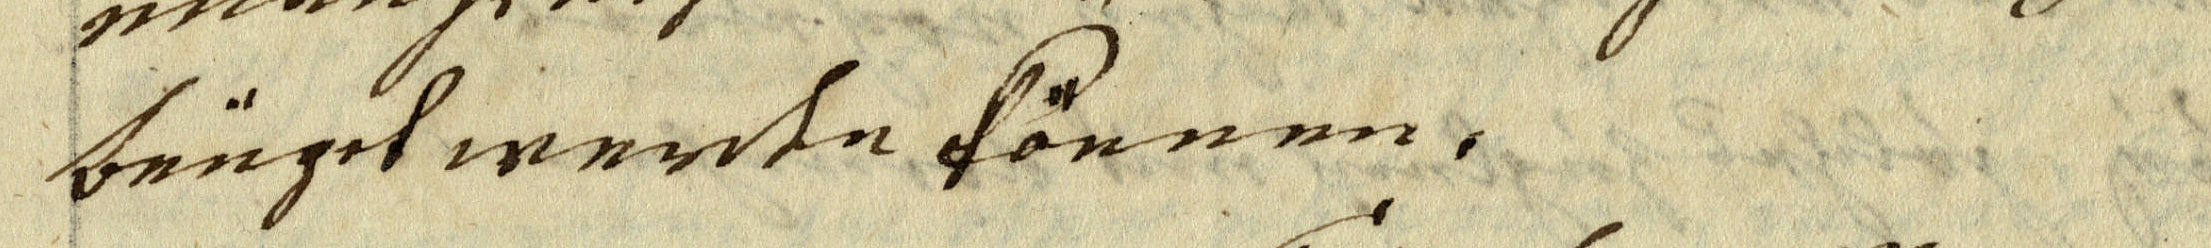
beuget werden können.
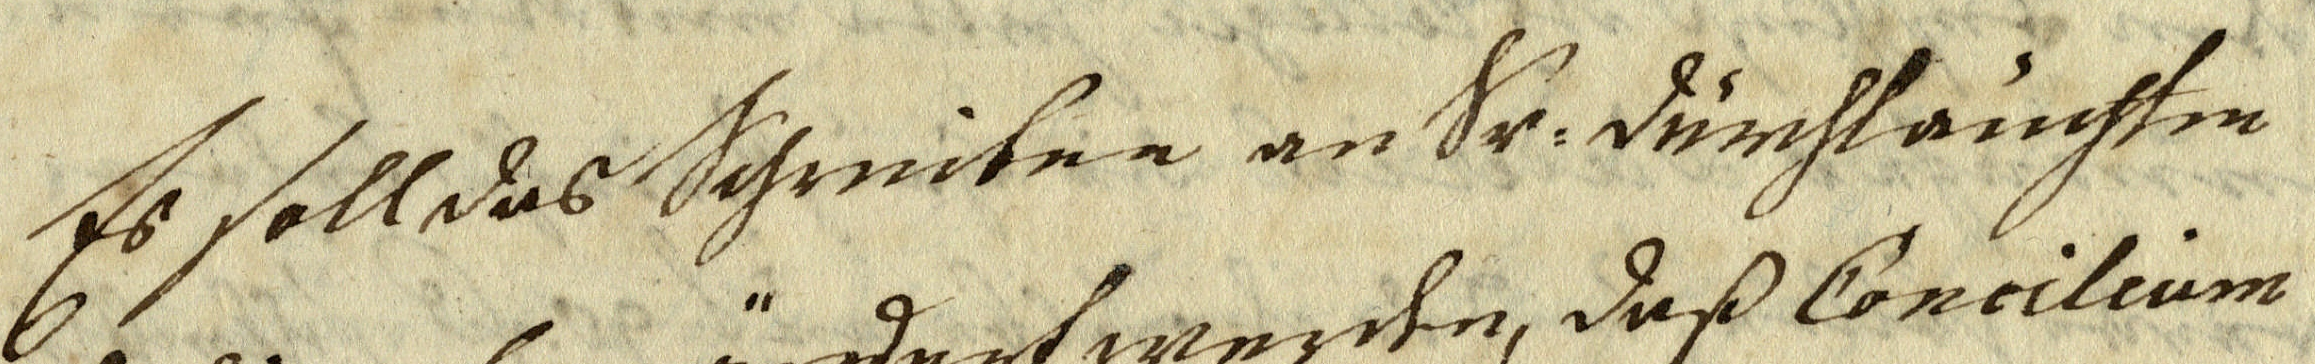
Es soll das Schreiben an Sr. Durchlauchten
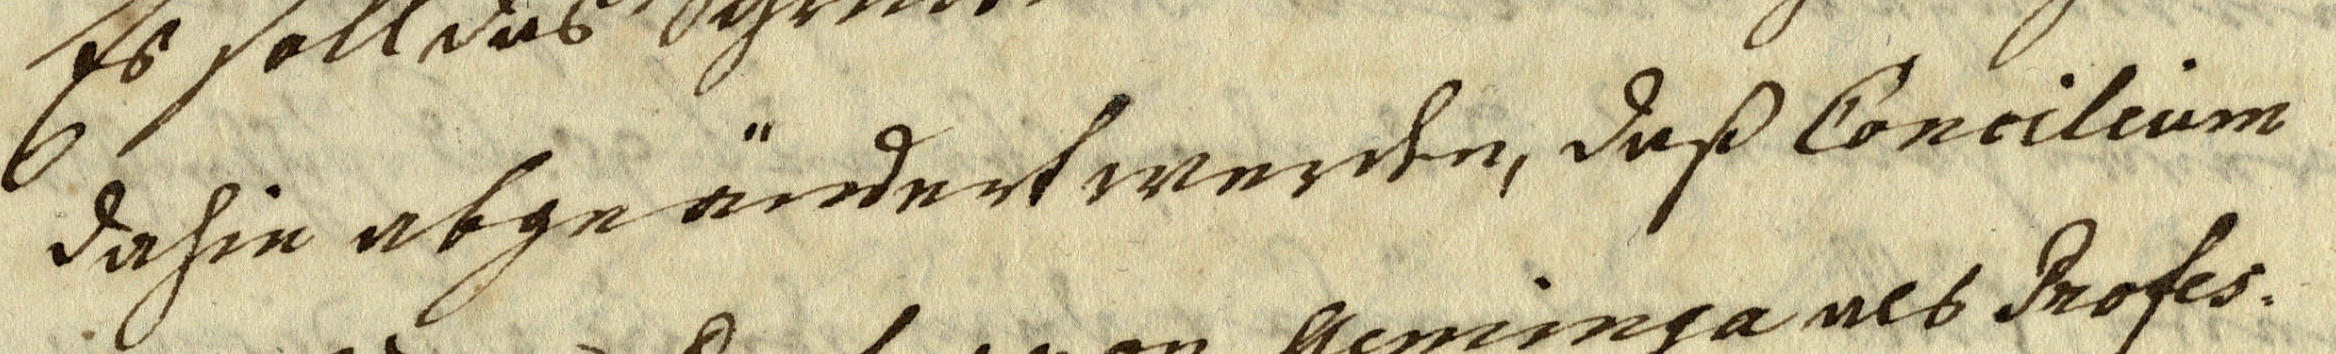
dahin abgeändert werden, daß Concilium
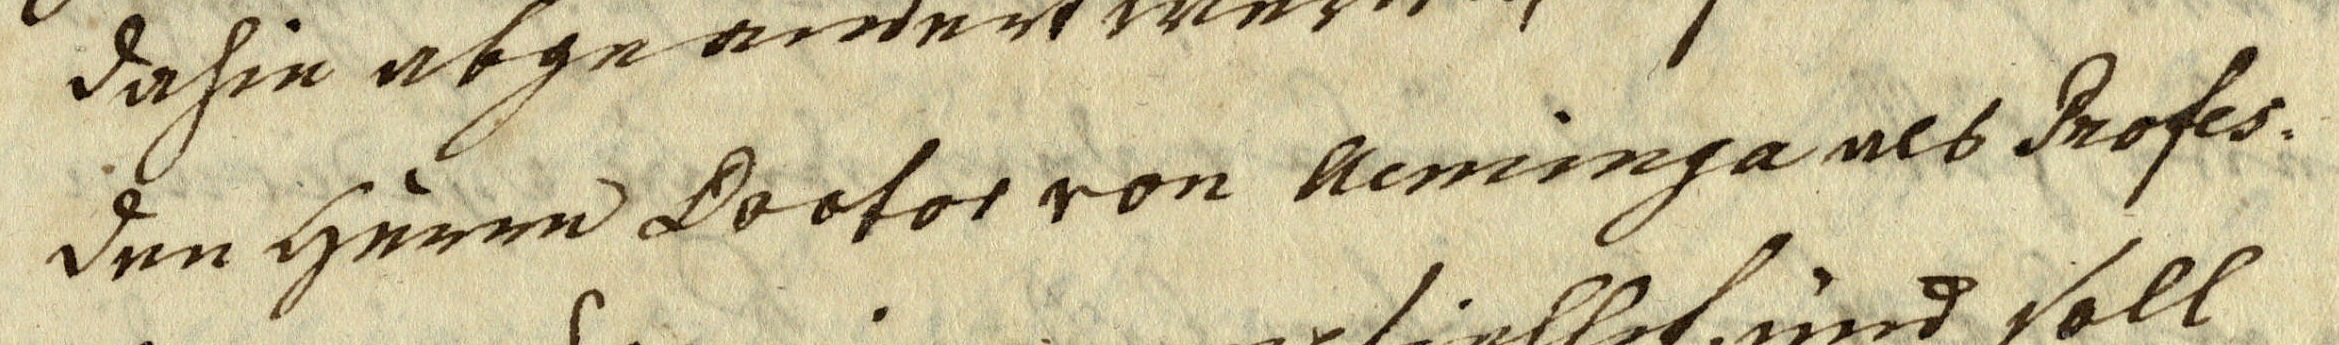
den Herrn Doctor von Aeminga als Profes¬
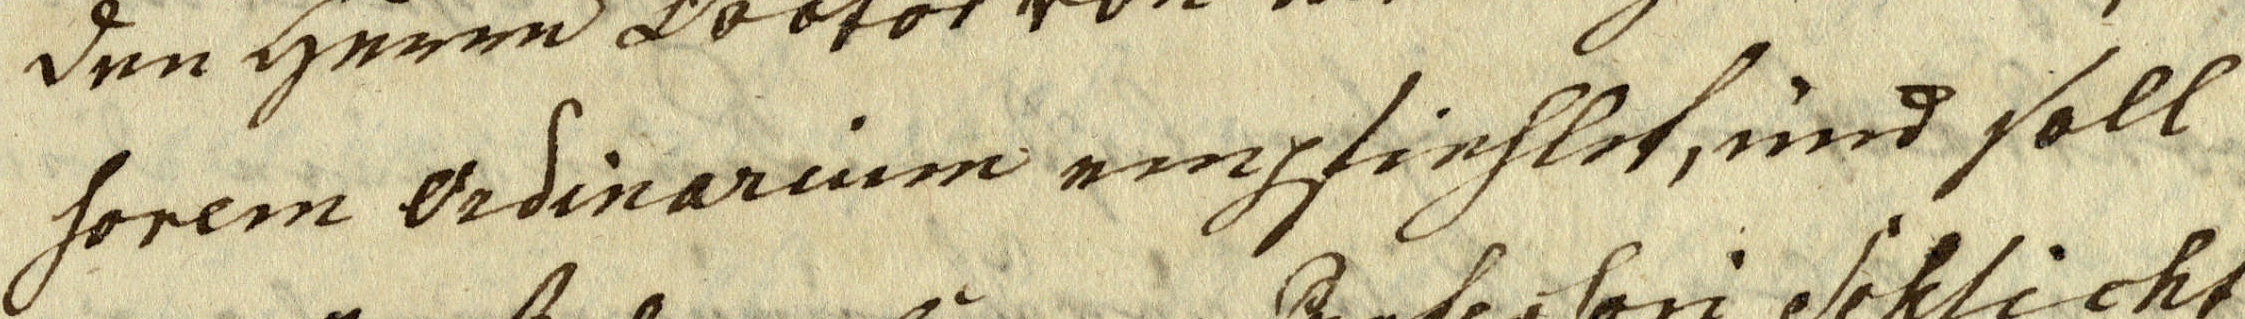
sorem ordinarium empfiehlet, und soll
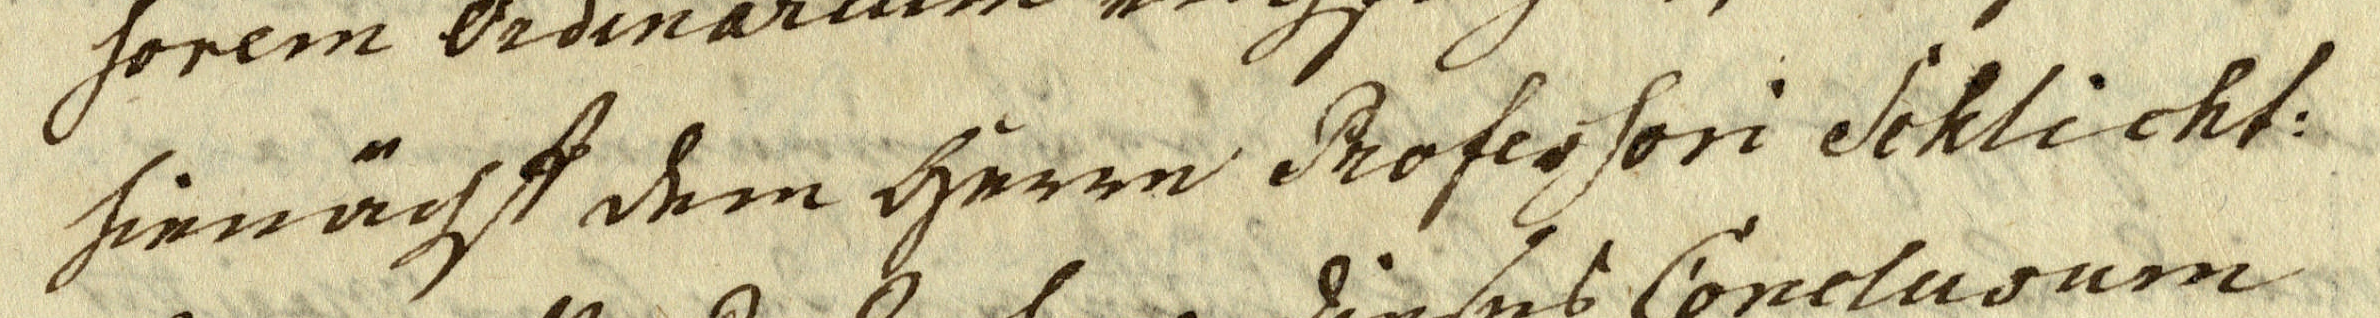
hienächst dem Herrn Professori Schlicht¬
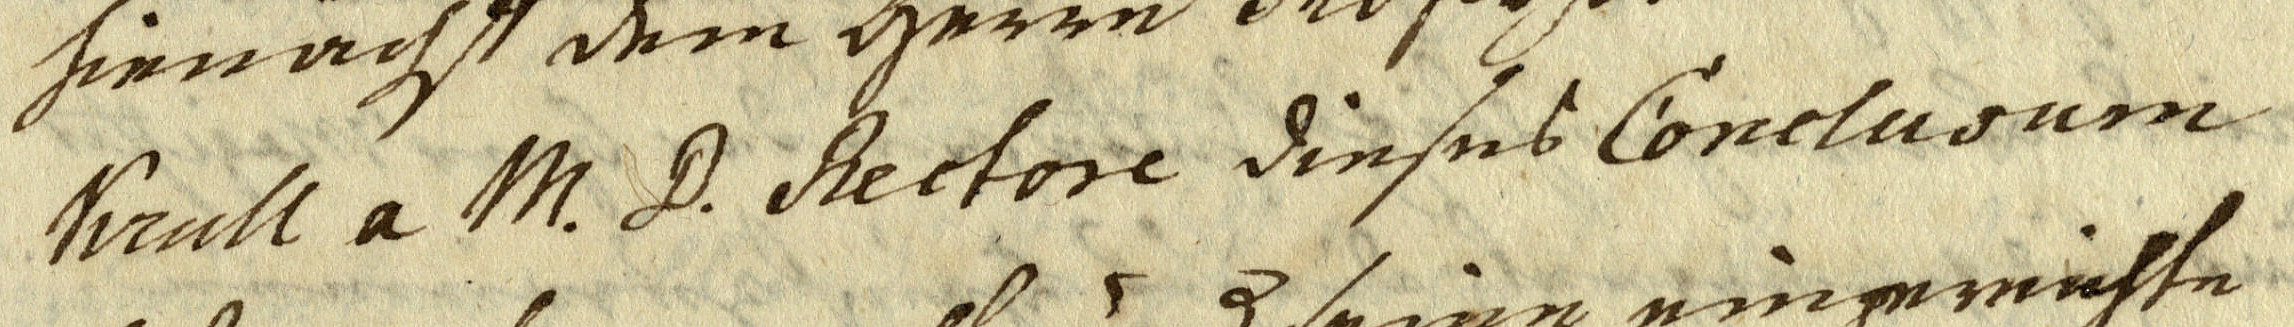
krull a M. D. Rectore dieses Conclusum
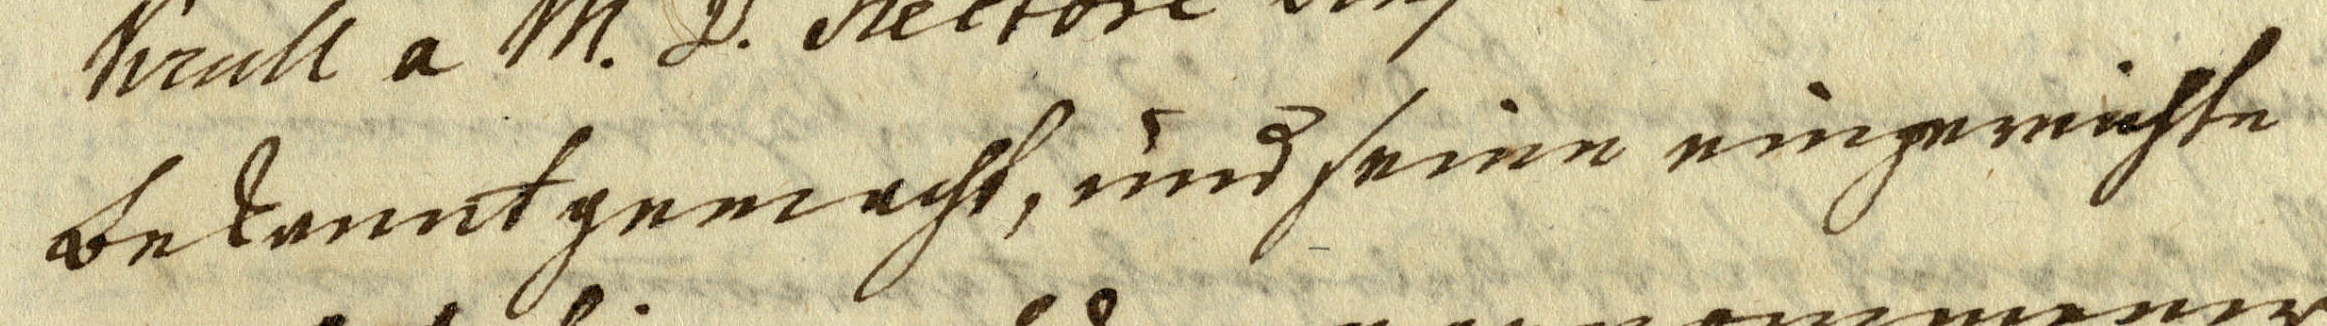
bekannt gemacht, und seine eingereichte
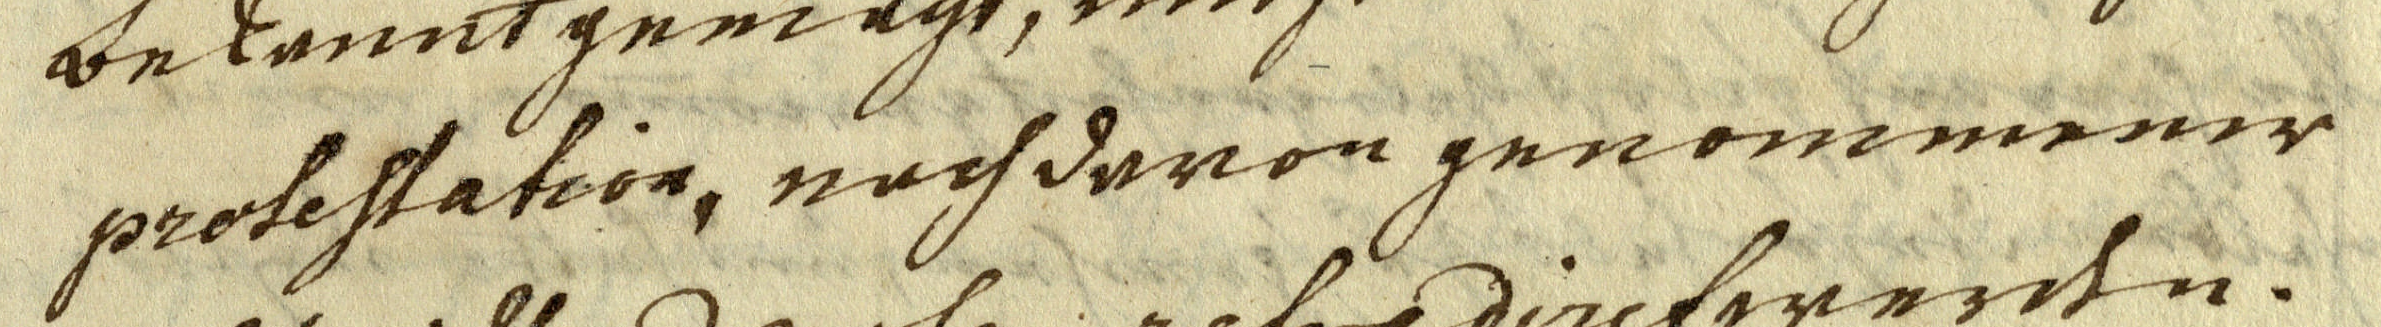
protestation, nach davon genommener
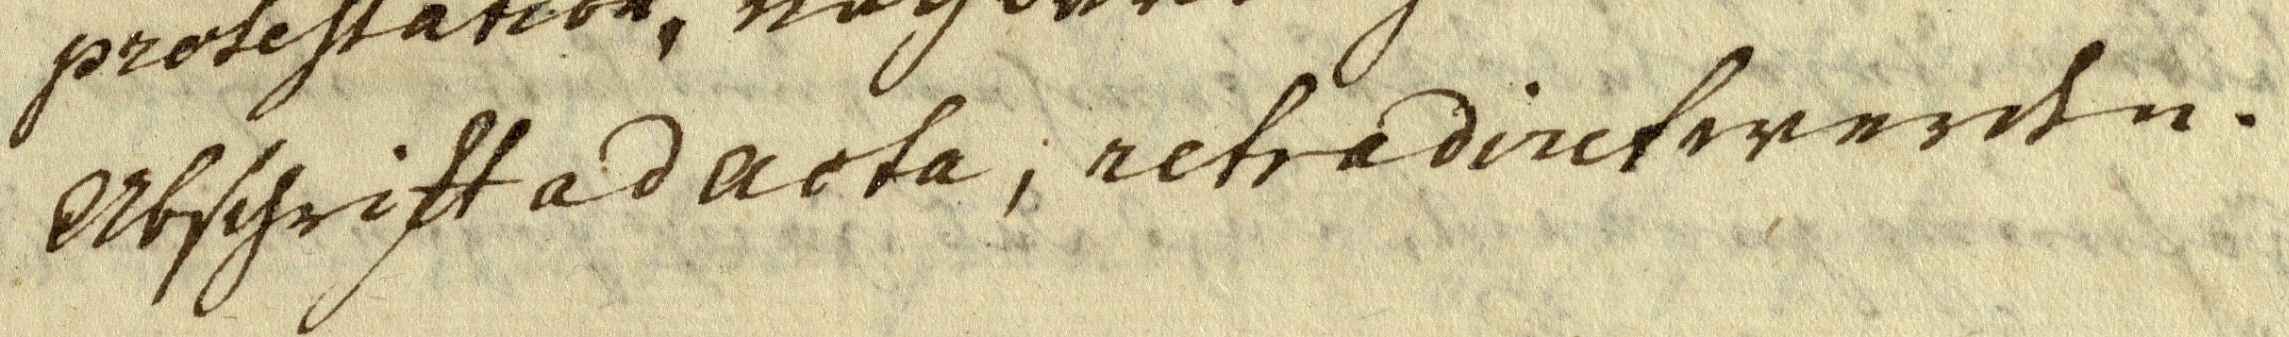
Abschrift ad Acta, retradiret werden.
